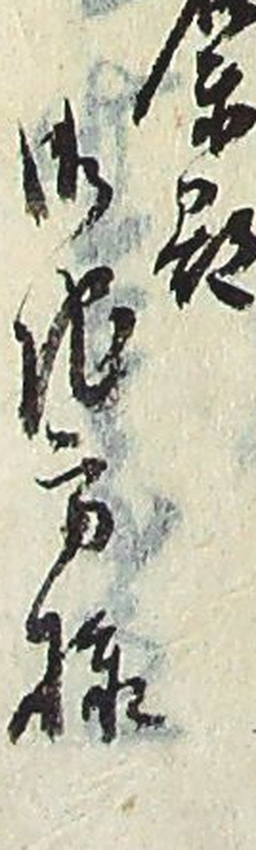御地方様

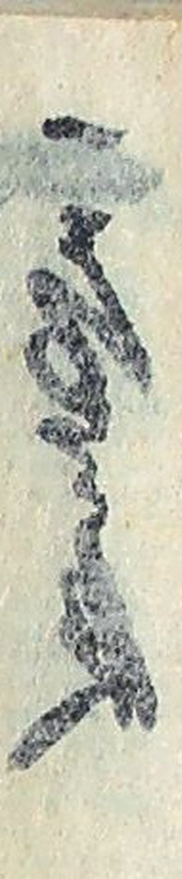正月十一日
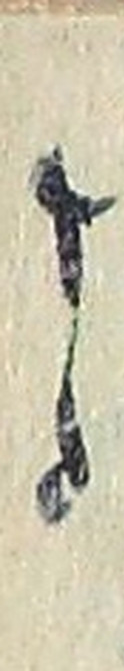廿九日
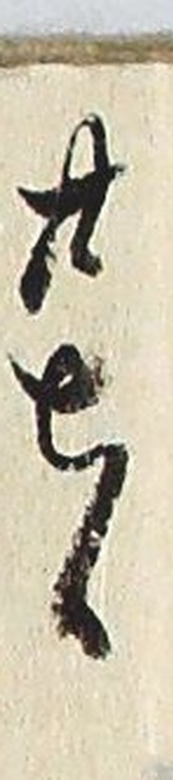廿七日
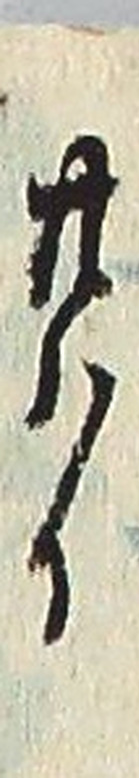廿八日
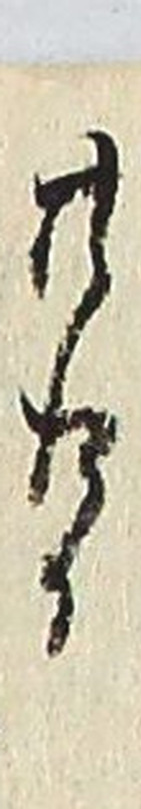廿九日
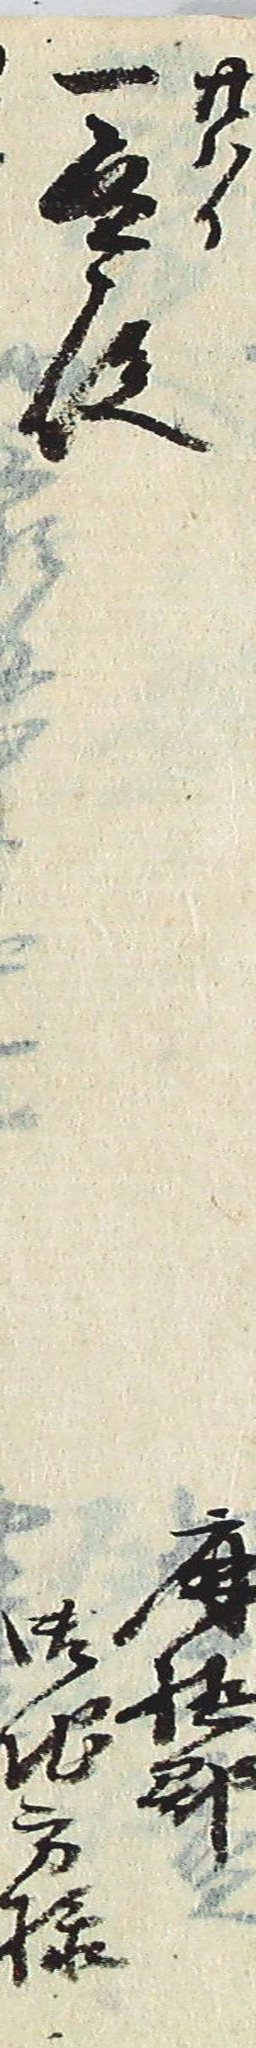一昼夜惣御地方様
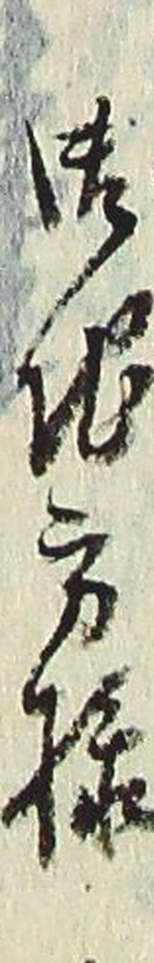御地方様
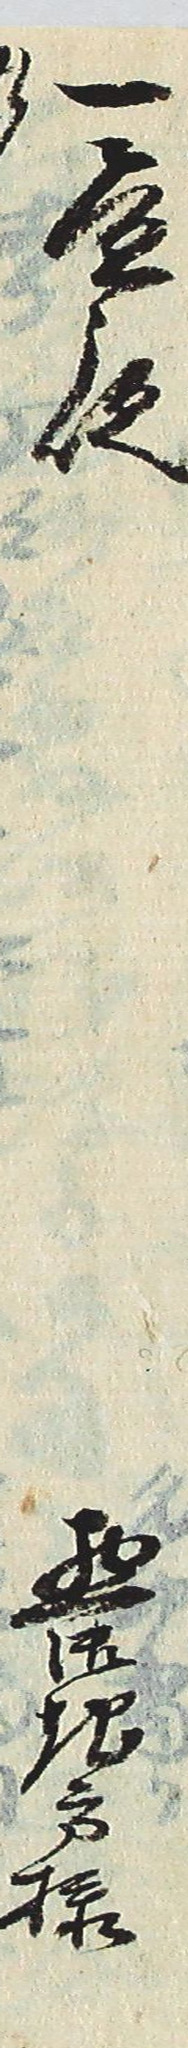一昼夜惣御地方様
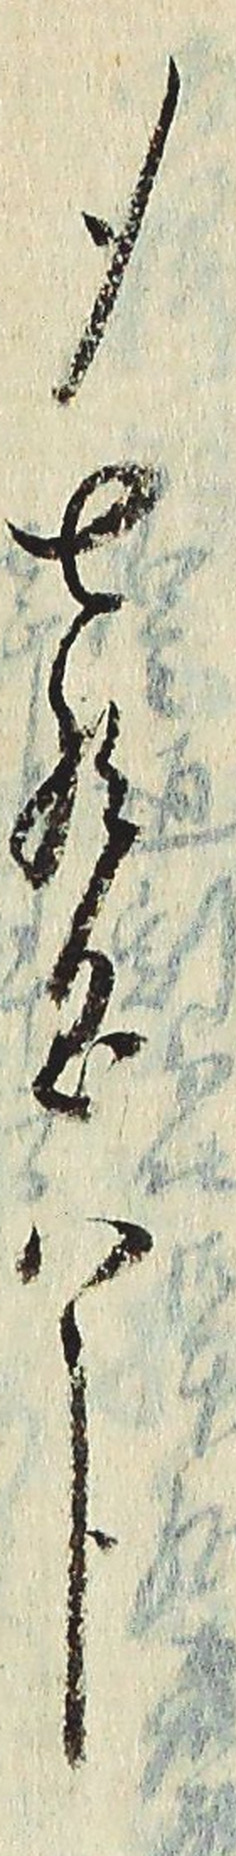〆七拾匁八分
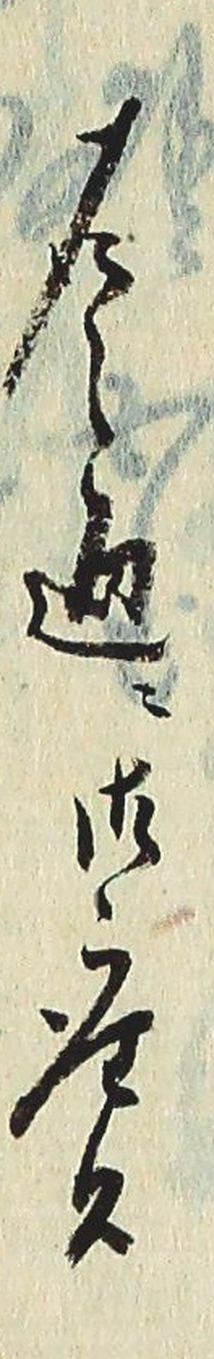右之通に御座候
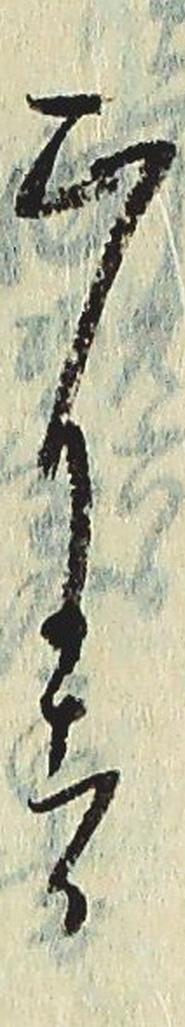正月十一日
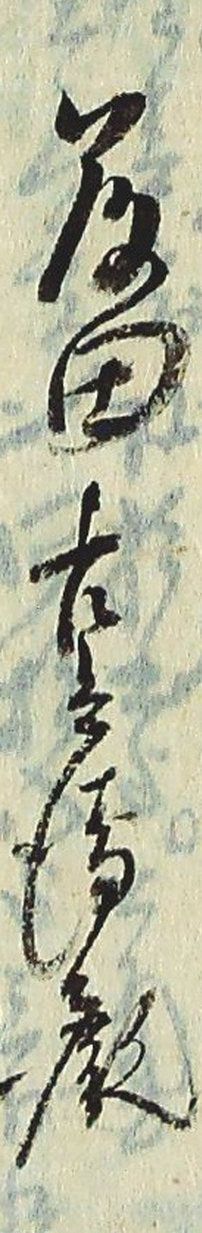藤田左兵衛殿
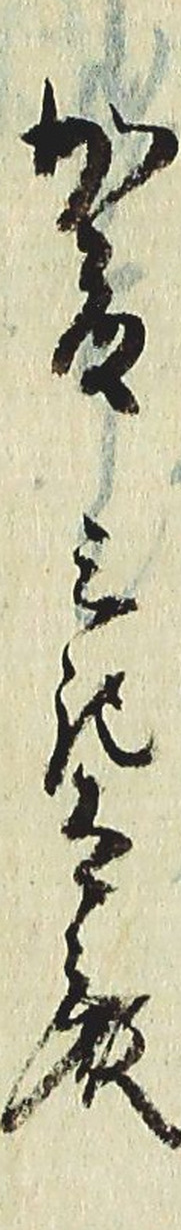加藤三紀太殿
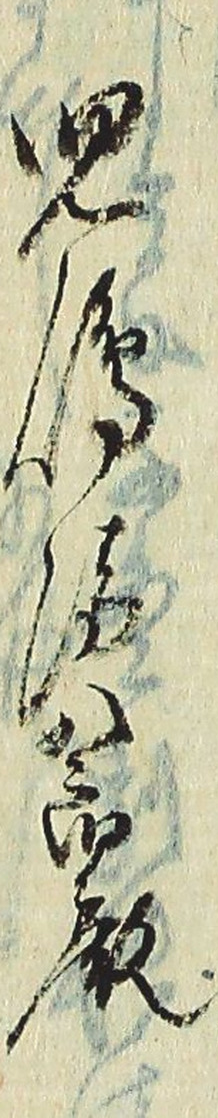児島清八郎殿
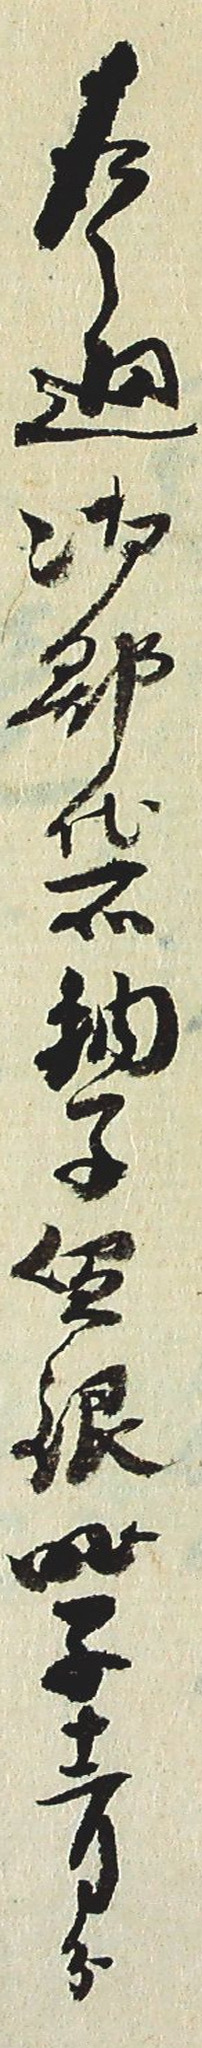右之通御郡代所銅子賃銀昨子十二月分
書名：名東郡中諸割賦元帳
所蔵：鳴門教育大学 Naruto University of Education
